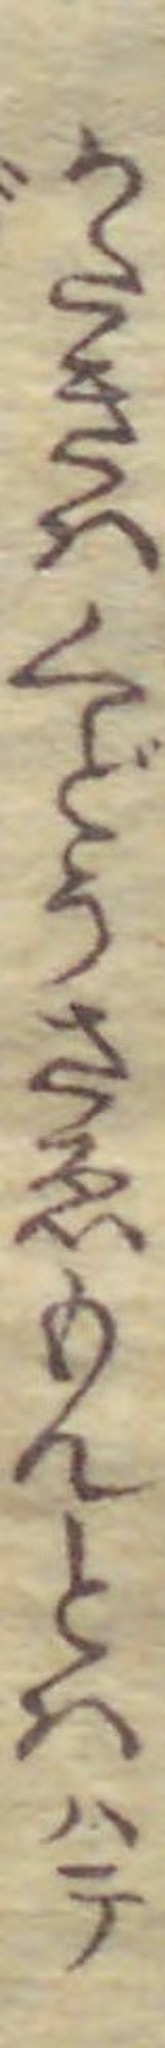かたきはくどうさゑもんとはハテ
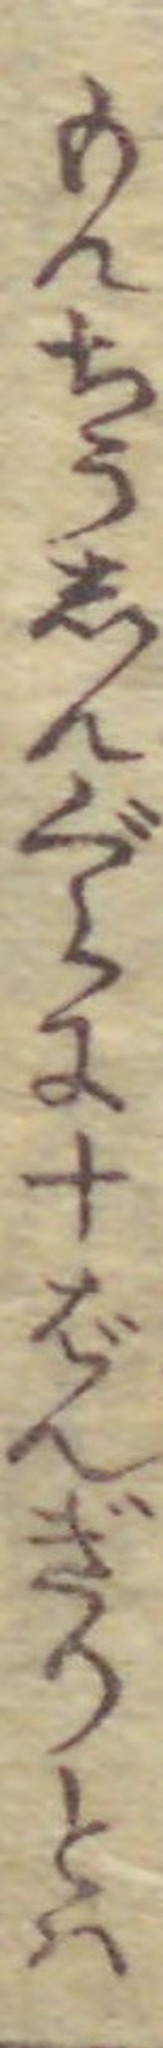もんちうしんぐらに十ばんぎりとは
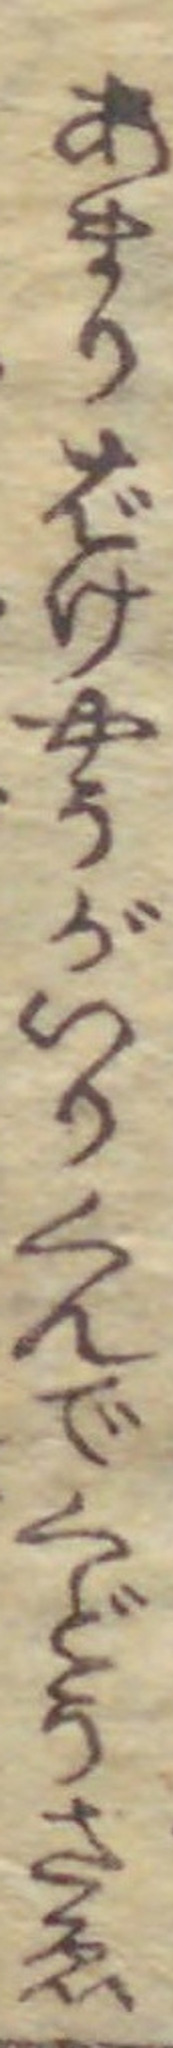あまりばけやうがいりくんでくどうさゑ
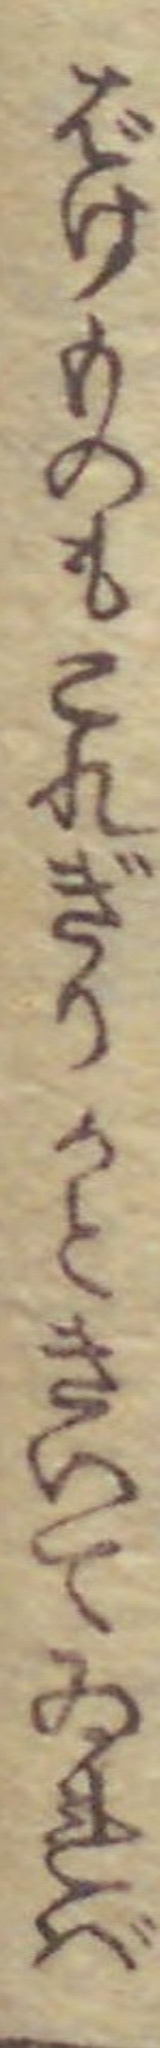ばけものもこれぎりかときいてゐれば
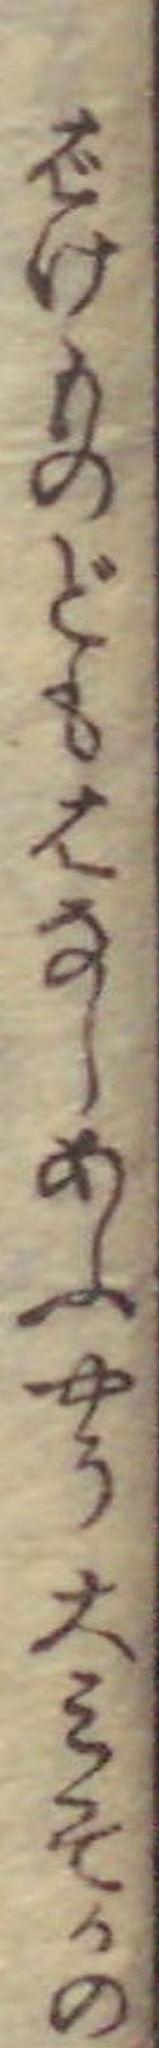ばけものどもはなしあうやう大みそかの
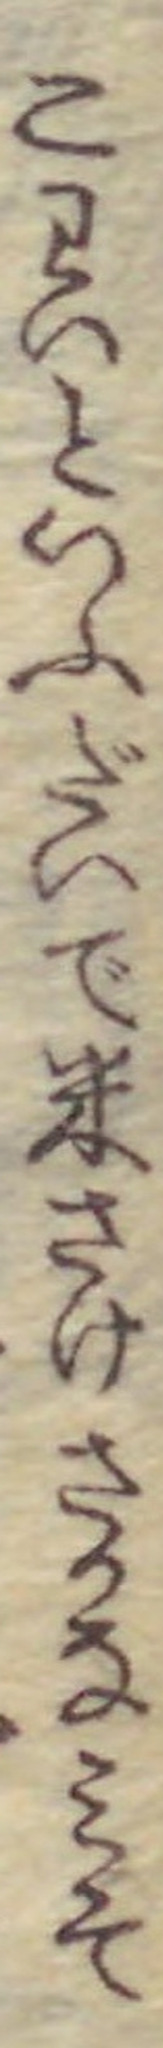こわいといふだいで米さけさかなみそ
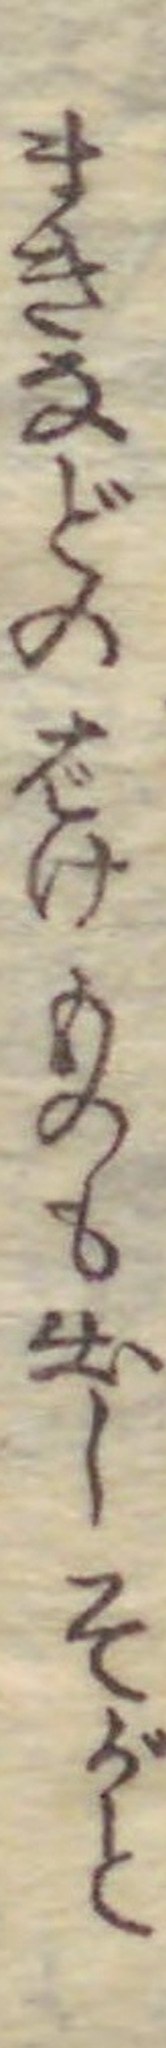まきなどのばけものも出しそがと
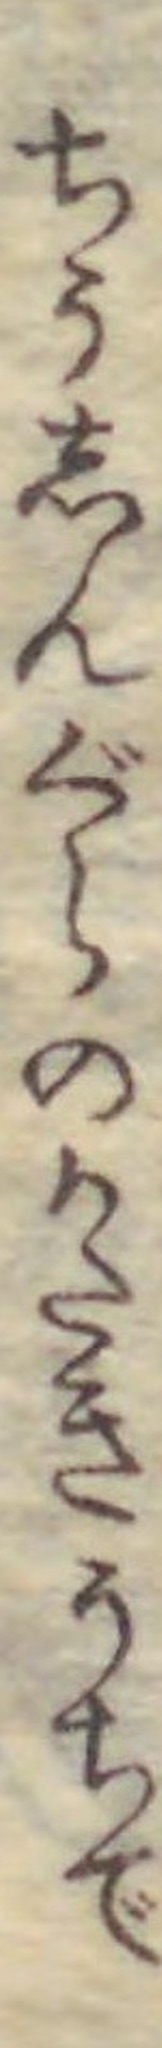ちうしんぐらのかたきうちで
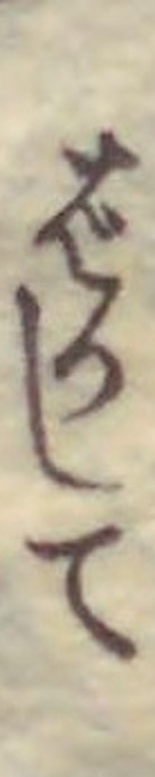ばかして
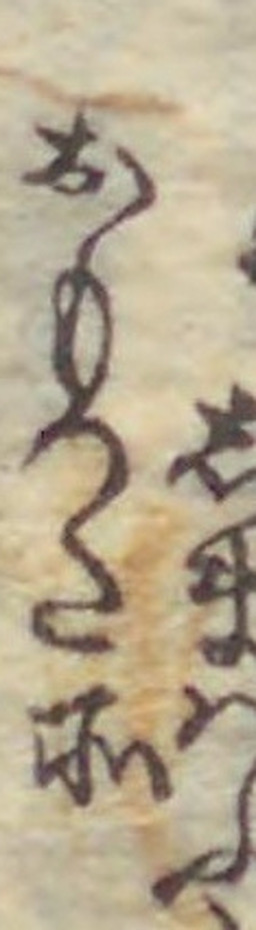おもつた所
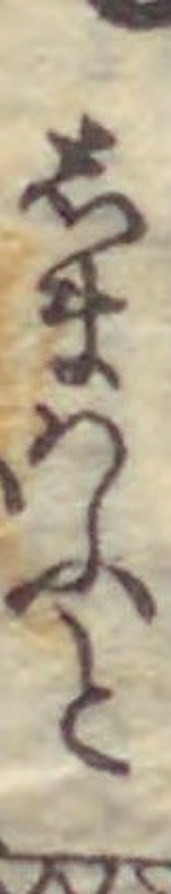しまはふと
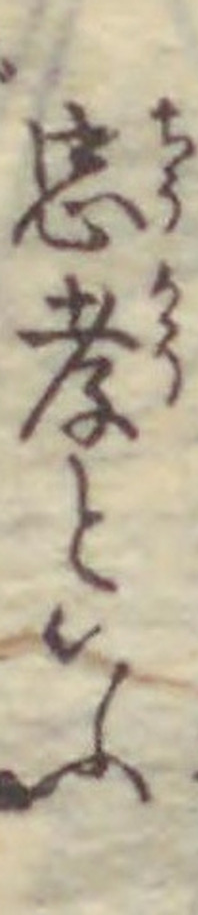忠孝といふ
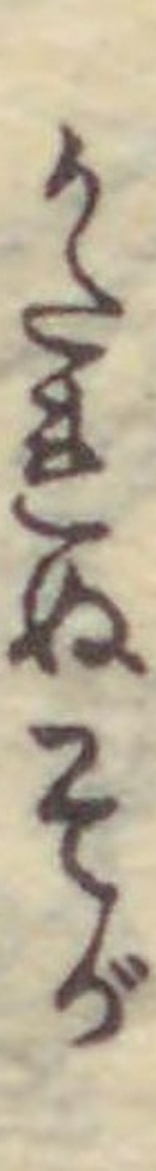かたれぬそが
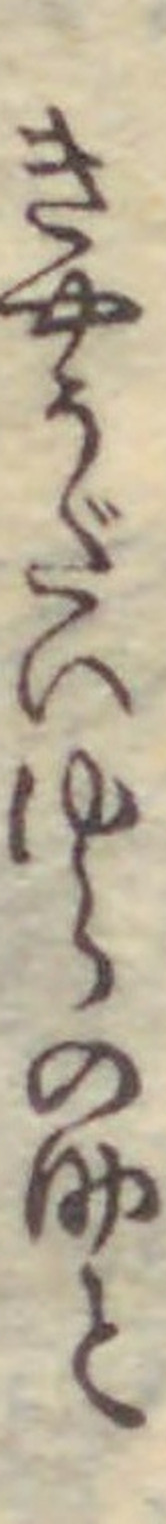きやうだいのゆらの助と
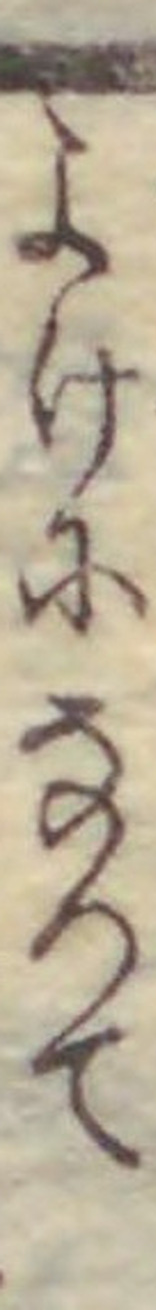よけになつて
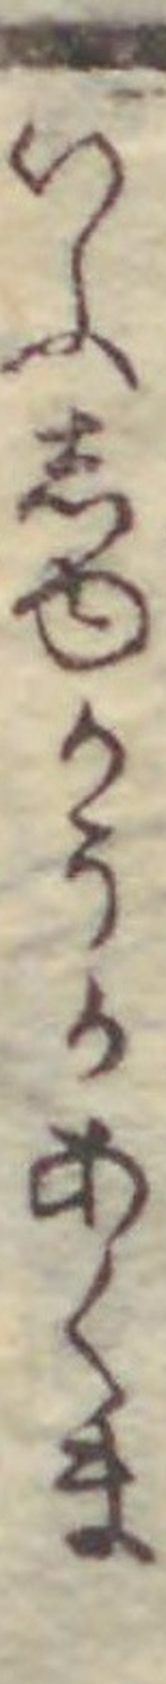いふしゆかうかあくま
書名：大時代唐土化物 3巻. 曽我太夫染
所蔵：国立国会図書館 National Diet Library, JAPAN
